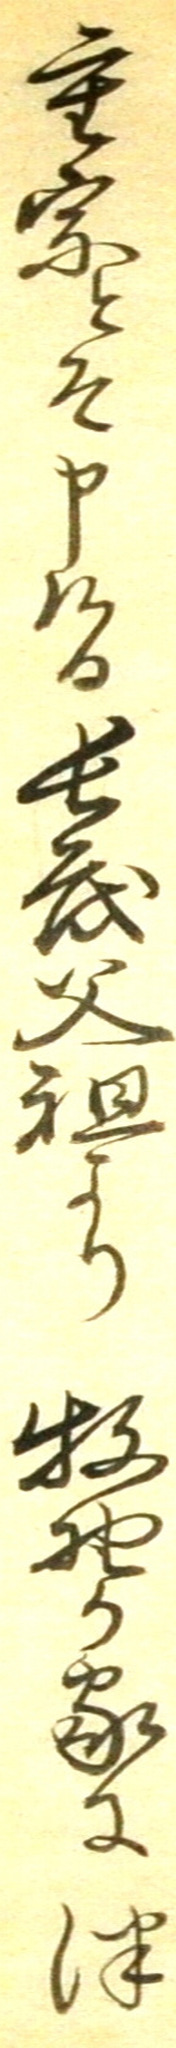重宗とそ申ける長茂父祖より牧野か家につ
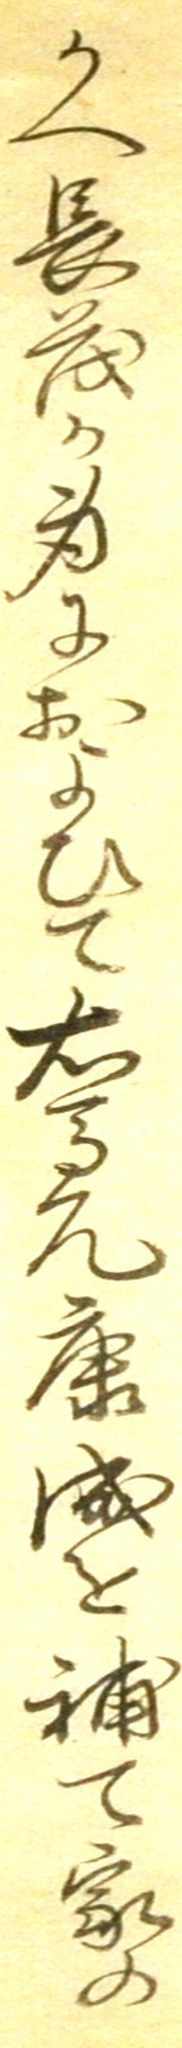かへ長茂か身におよひて右馬允康成を補て家の
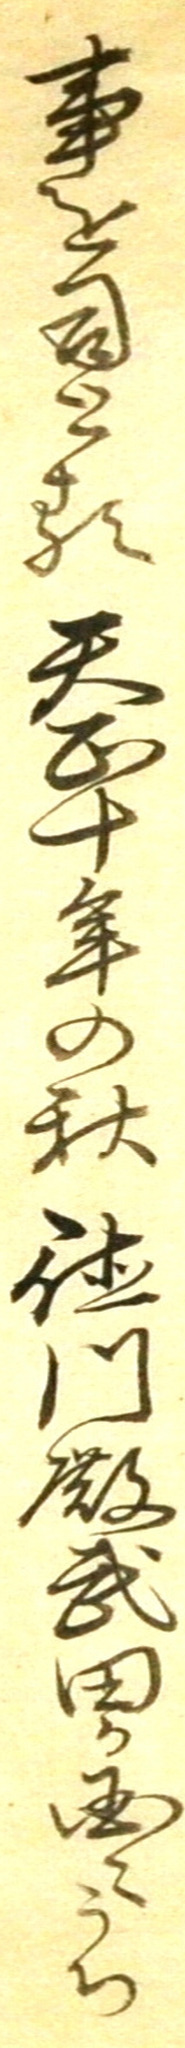事を司とる天正十年の秋徳川殿武田か国にうち
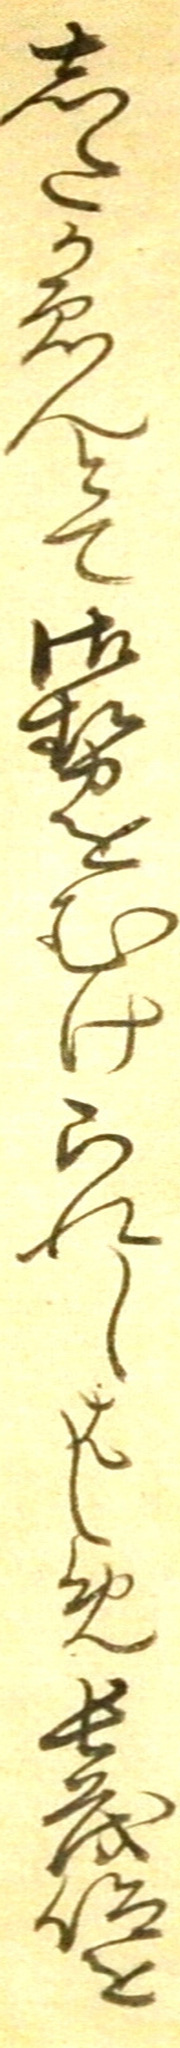したかゑんとて御勢をむけられしはしめ長茂仰を
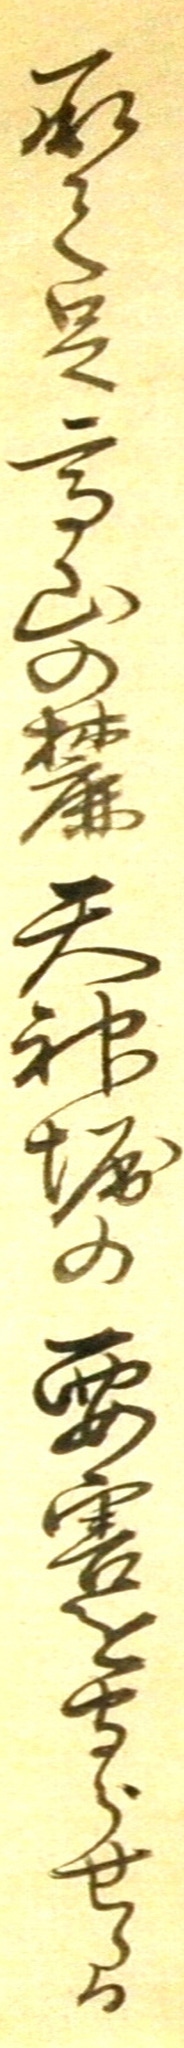承て足高山の麓天神堀の要害を守らせらる

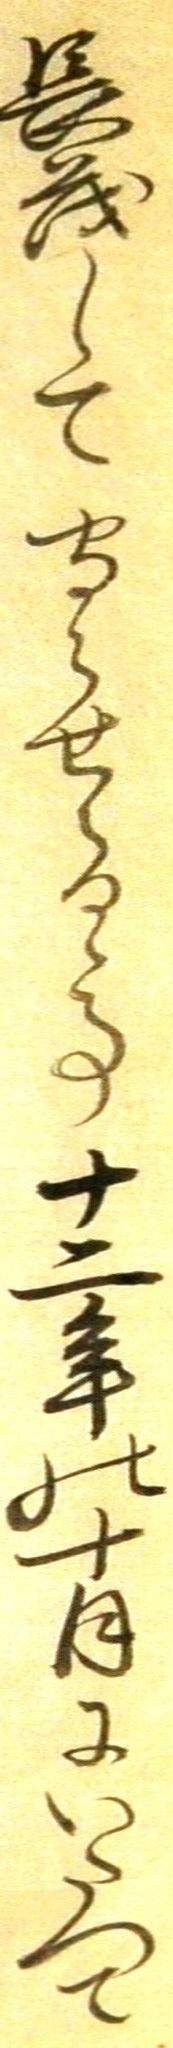長茂して守らせらるゝ事十二年の十月にいたつて
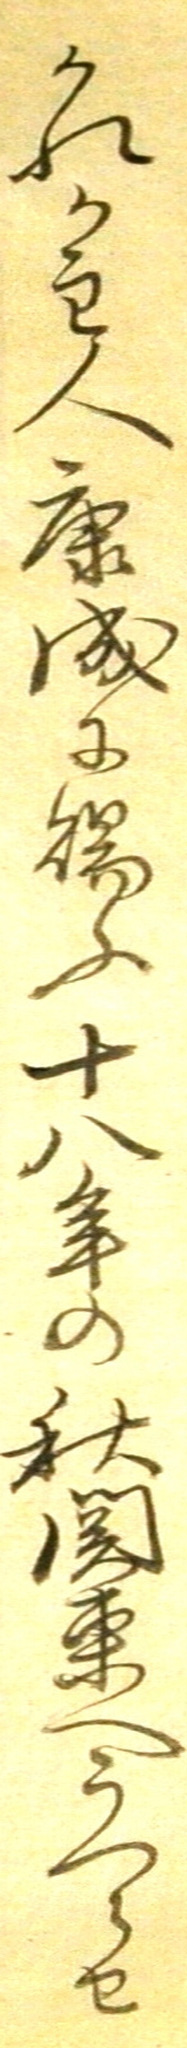かれか主人康成に賜ふ十八年の秋関東へうつらせ
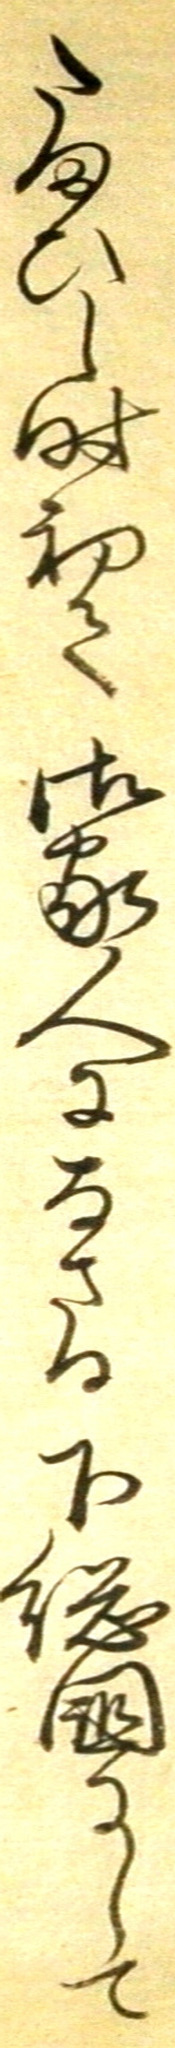たまひし時初て御家人になさる下総国にして
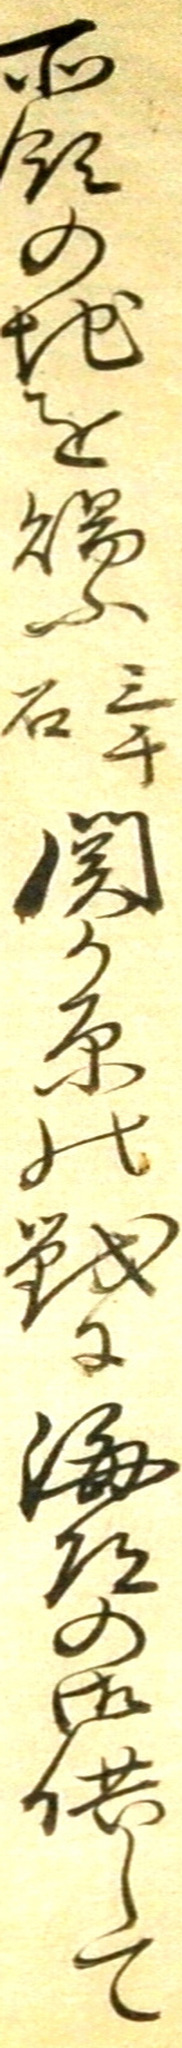所領の地を賜ふ三千石関か原の戦に海道の御供して
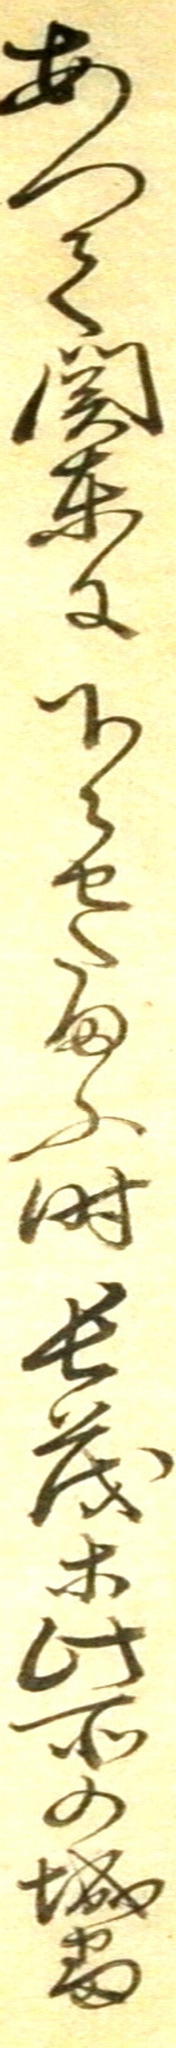あつて関東に下らせたまふ時長茂等此所の城番
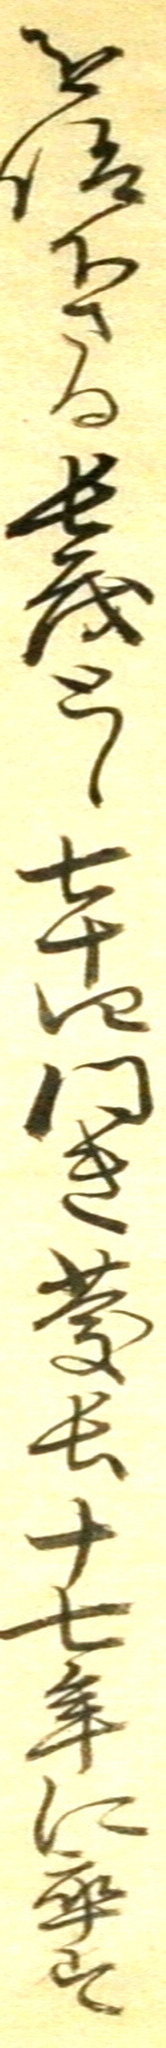を仰下さる長茂とし七十四同き慶長十七年に卒す
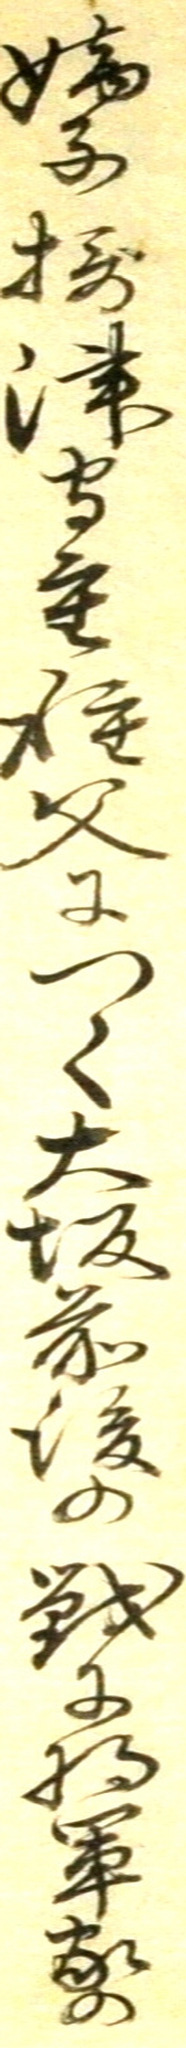嫡子摂津守重種父につく大坂前後の戦に将軍家の
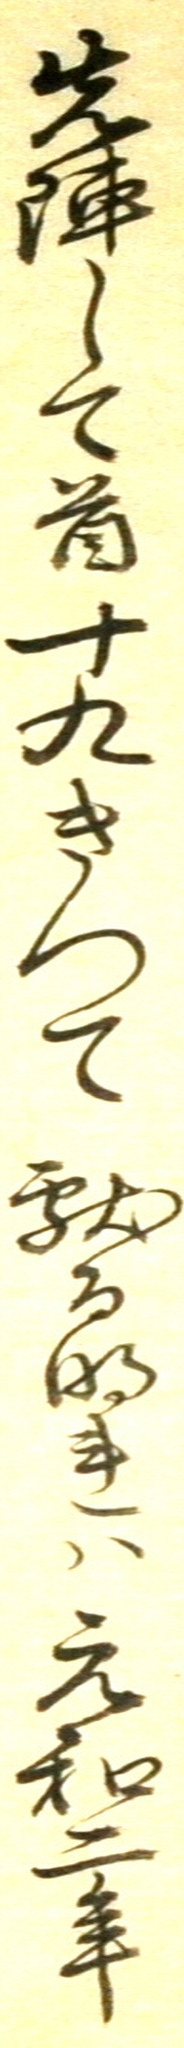先陣して首十九きつて献る明れは元和二年
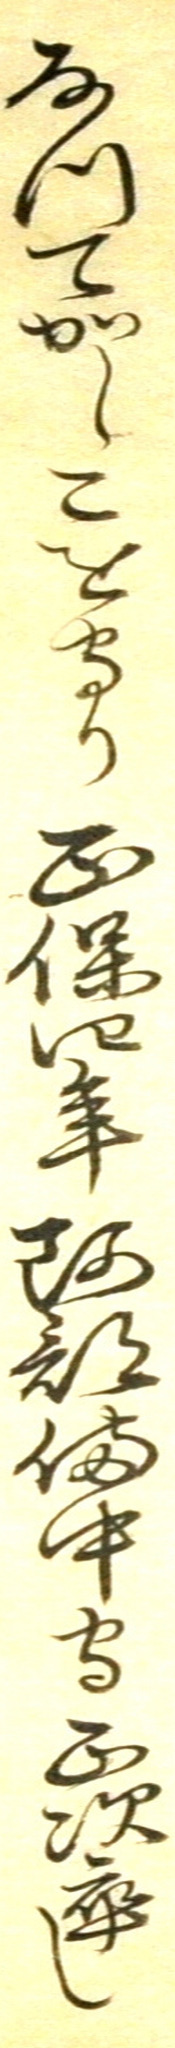なつてかしこを守り正保四年阿部備中守正次卒し
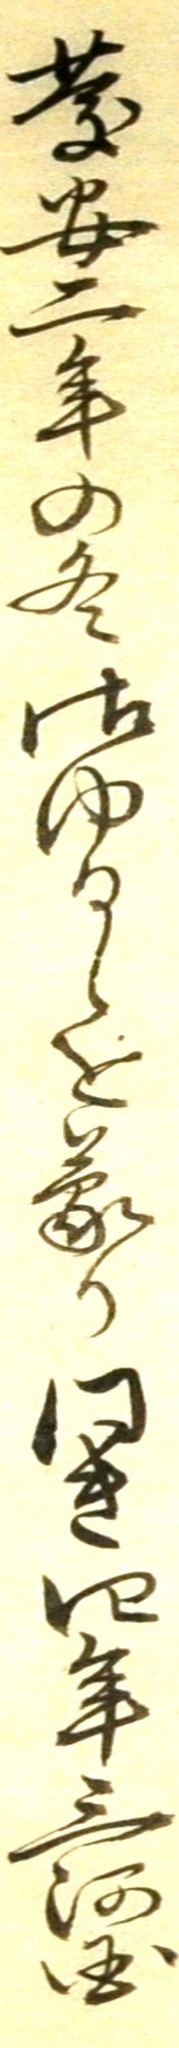慶安二年の冬御ゆるしを蒙り同き四年三河国
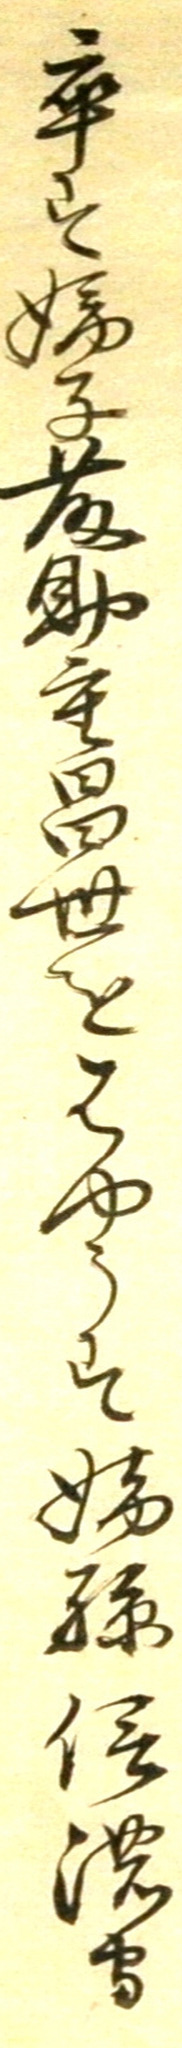卒す嫡子藤助重昌世をはやうす嫡孫信濃守
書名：藩翰譜（五）
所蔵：伊那市立高遠町図書館・合同会社AMANE
